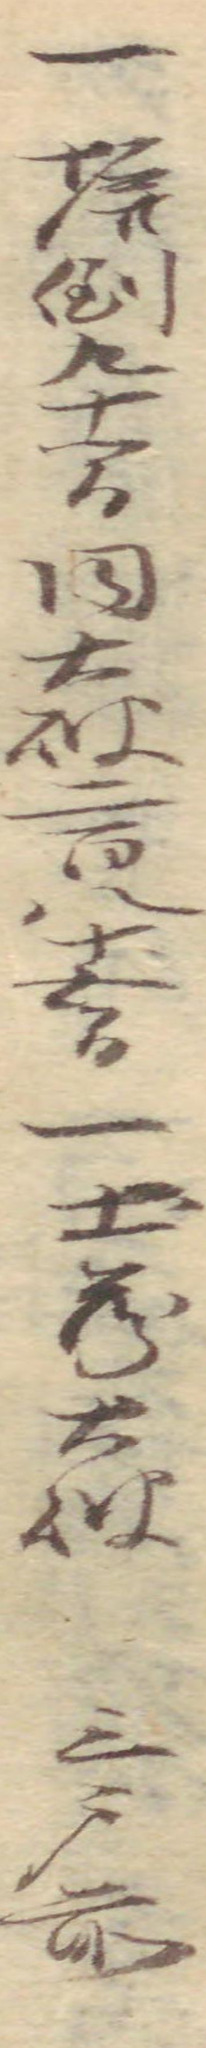一塀倒九十間同大破二百八十七間一土蔵大破三戸前
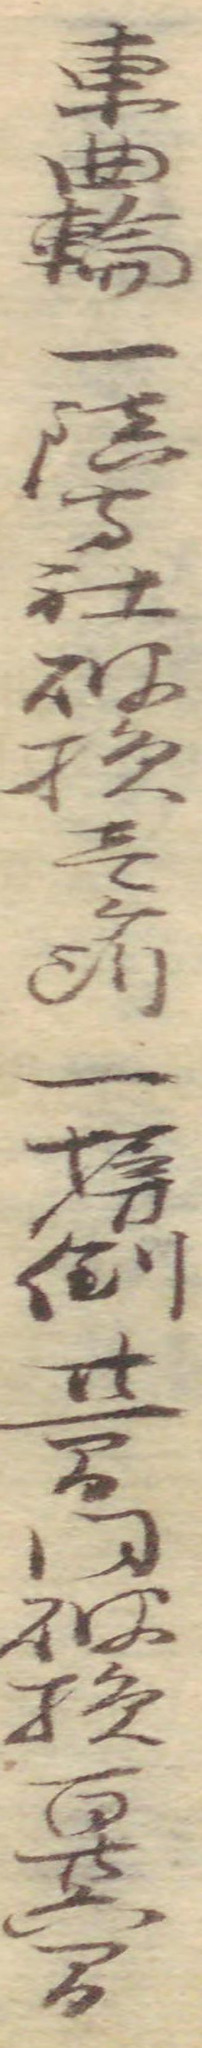東曲輪一鎮守社破損壱ケ所一塀倒廿一間同破損百廿六間
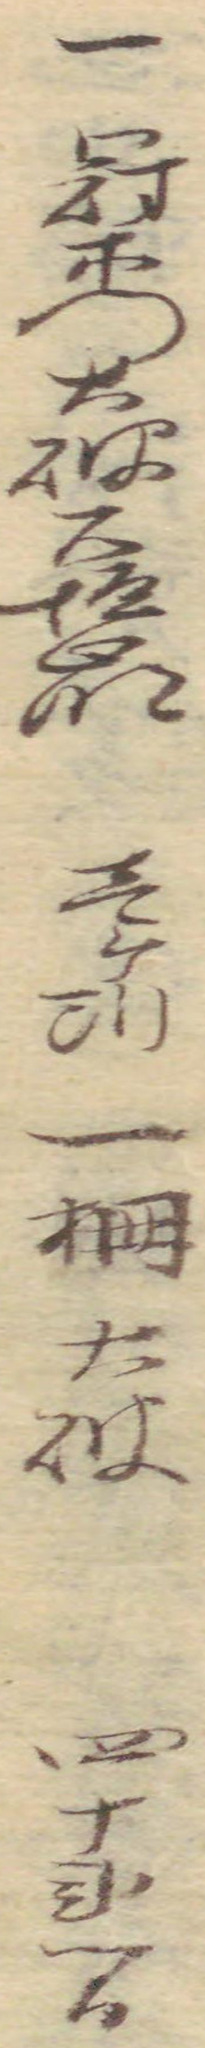一冠木門大破石垣崩壱ケ所一柵大破四十弐間
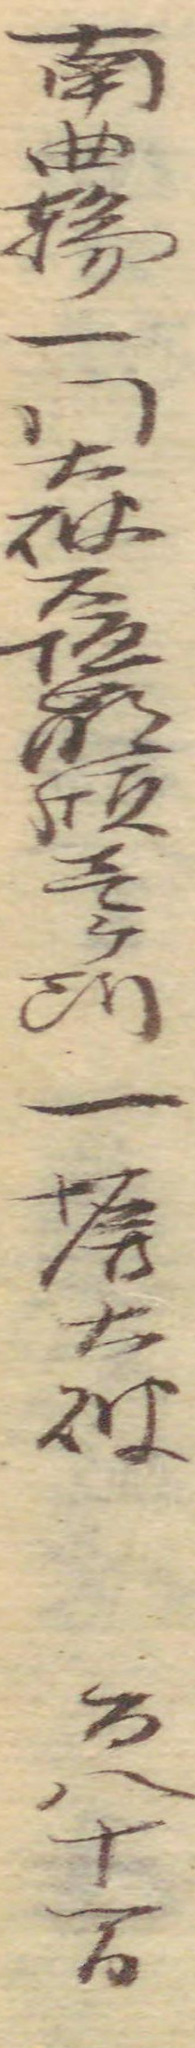南曲輪一門大破石垣崩傾壱ケ所一塀大破百八十間

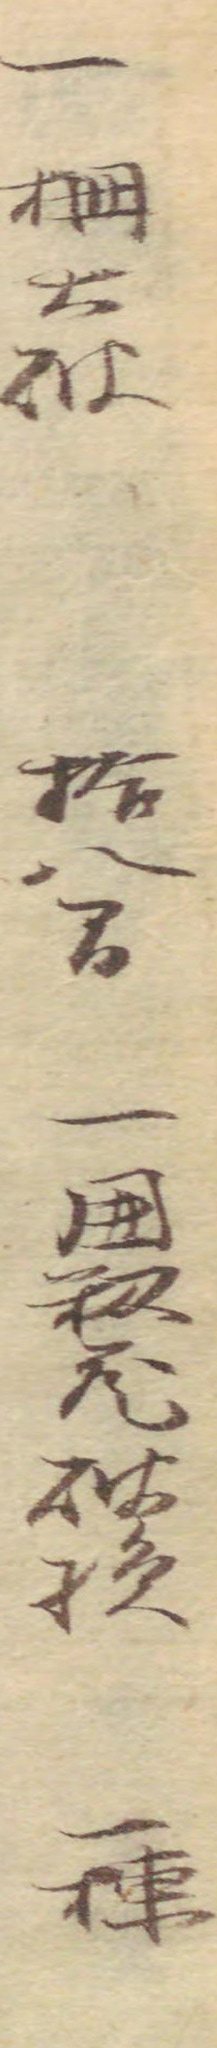一柵大破拾八軒一囲籾蔵破損一棟
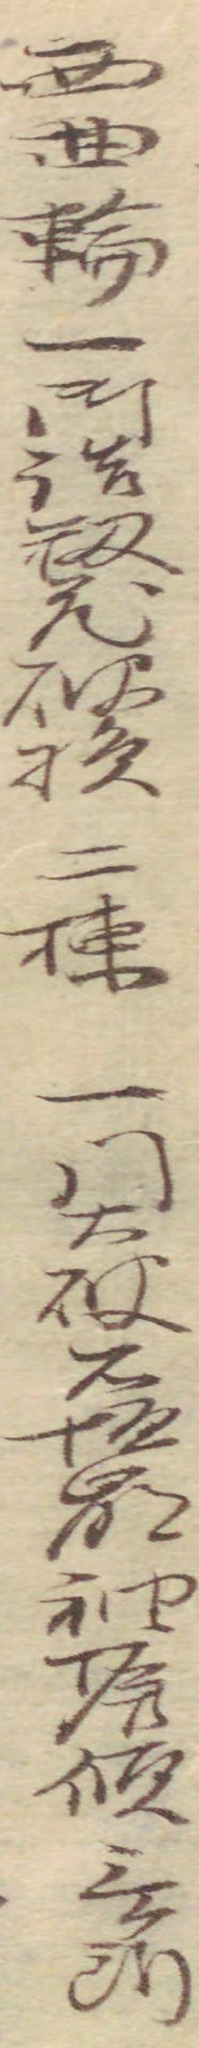西曲輪一御詰籾蔵破損二棟一門大破石垣崩袖塀傾三ケ所
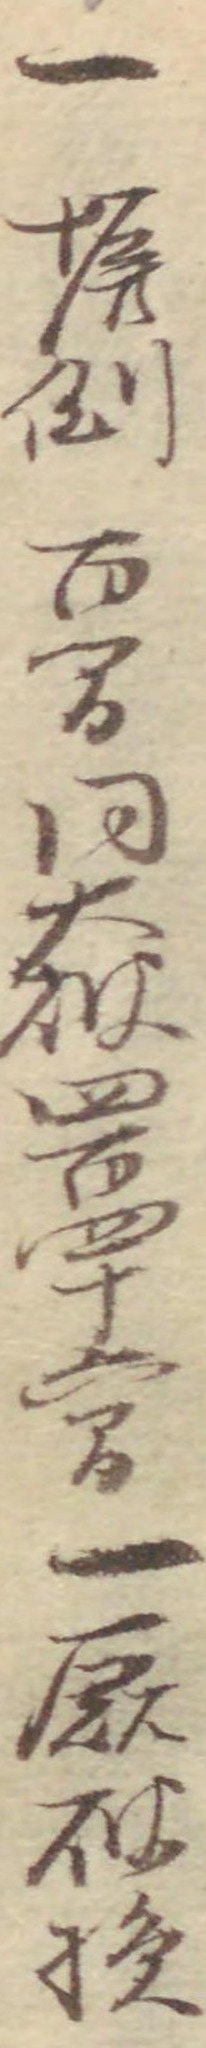一塀倒百間同大破四百四十六間一厩破損一棟
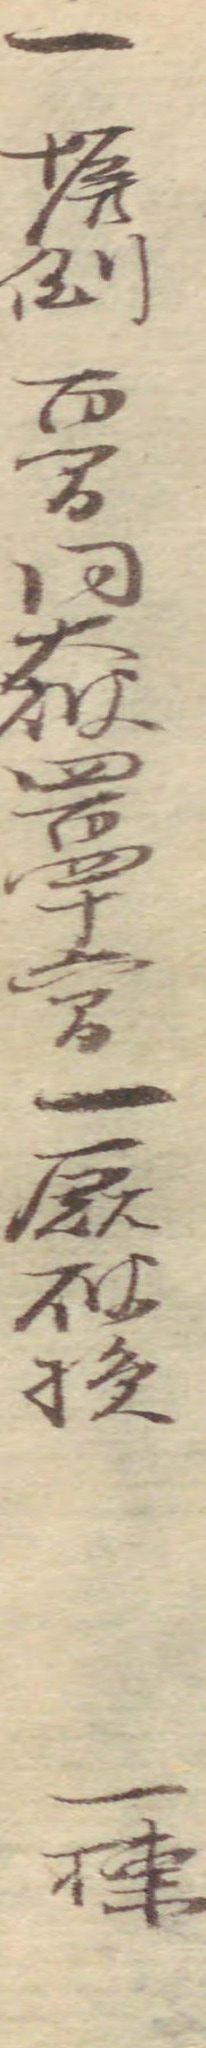一塀倒百間同大破四百四十六間一厩破損一棟
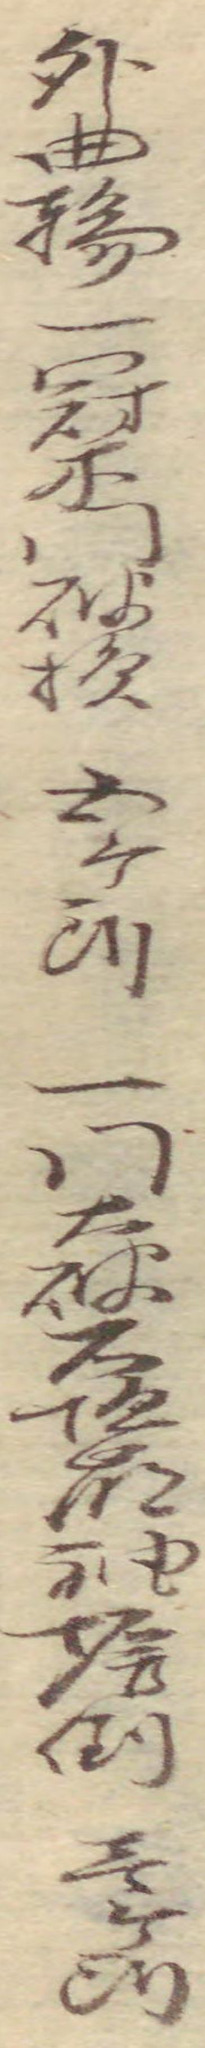外曲輪一冠木門破損五ケ所一門大破石垣崩袖塀倒壱ケ所
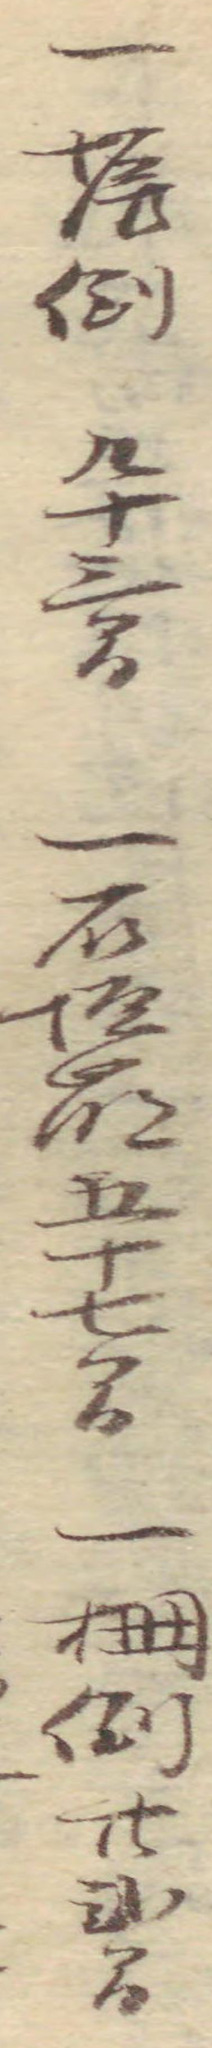一塀倒九十三間一石垣崩五十七間一柵倒廿弐間
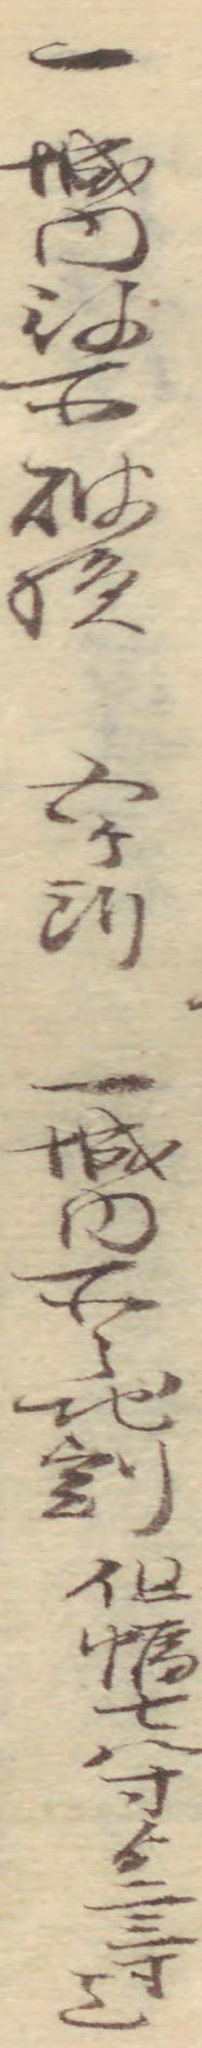一城内役所破損五ケ所一城内所〻地割但幅七八寸ゟ二三寸迄
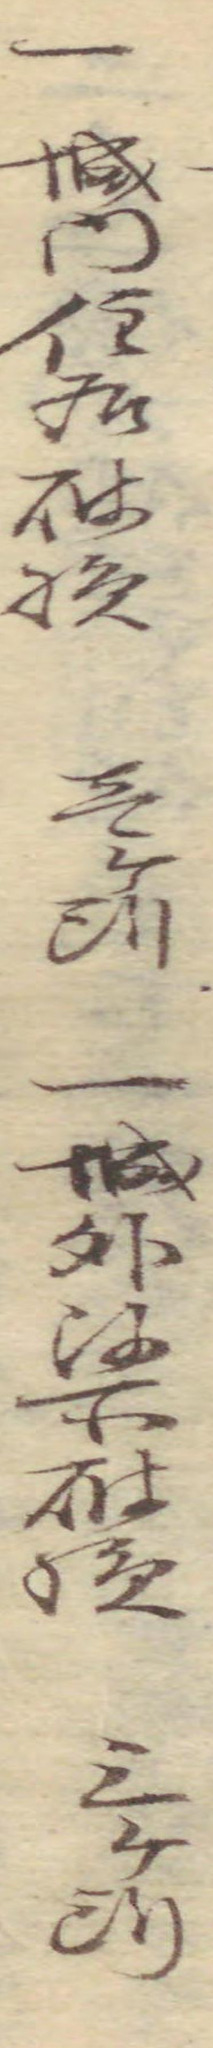一城内住居破損壱ケ所一城外役所破損三ケ所
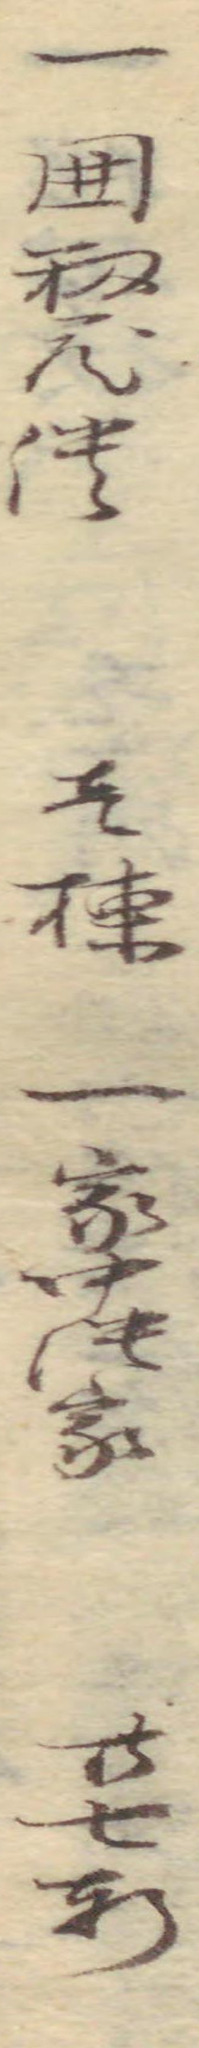一囲籾蔵潰壱棟一家中潰家廿七軒
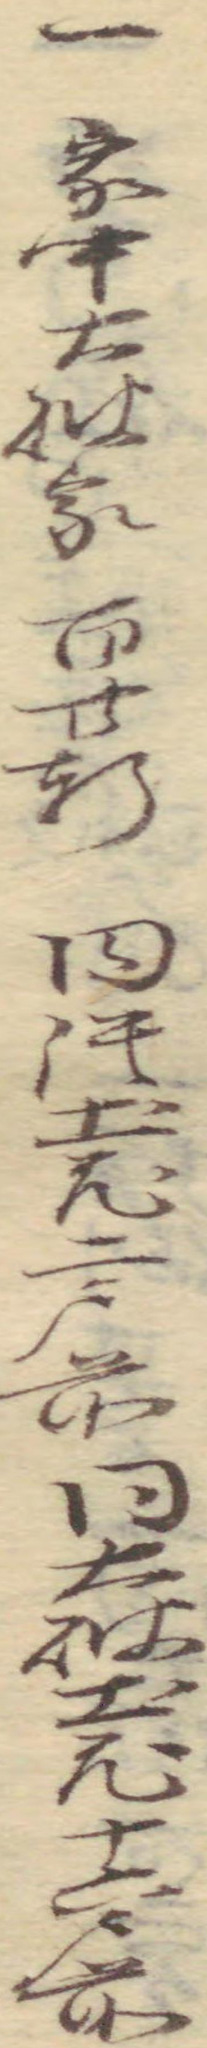一家中大破家百廿軒同潰土蔵二戸前同大破土蔵十六戸前
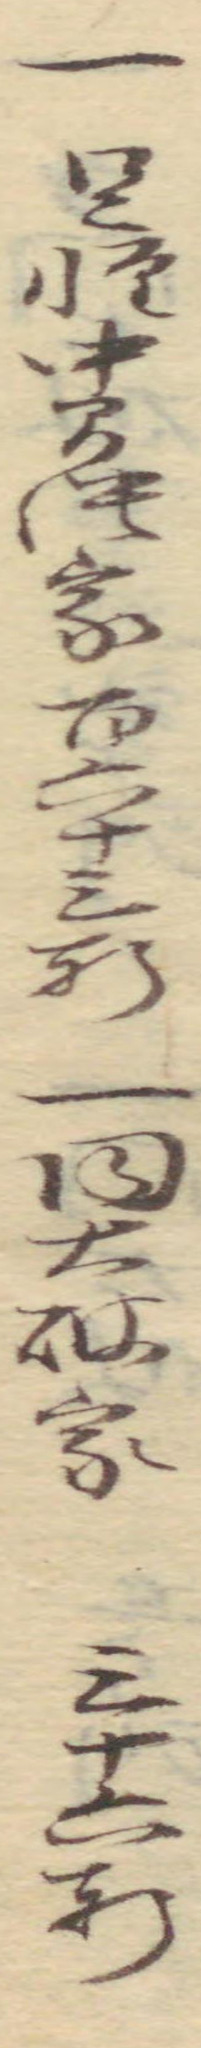一足軽中間潰家百六十三軒一同大破家三十六軒
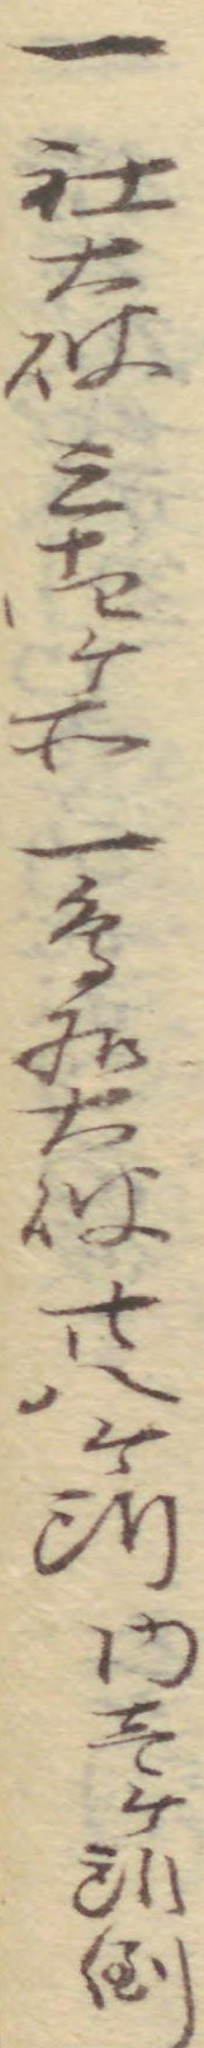一社大破三十四ケ所一鳥居大破廿八ケ所内壱ケ所倒
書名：鶯宿雑記. 巻199-200
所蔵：国立国会図書館 National Diet Library, JAPAN
